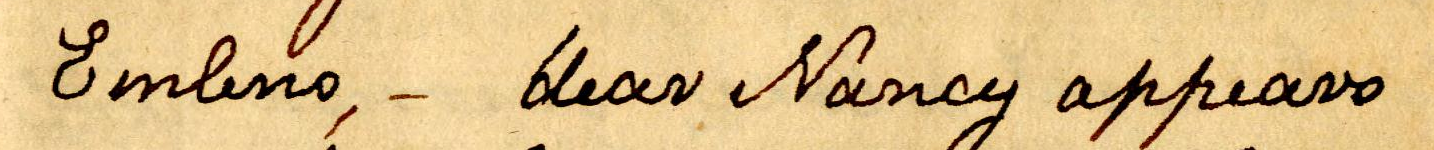Emlens,- dear Nancy appears
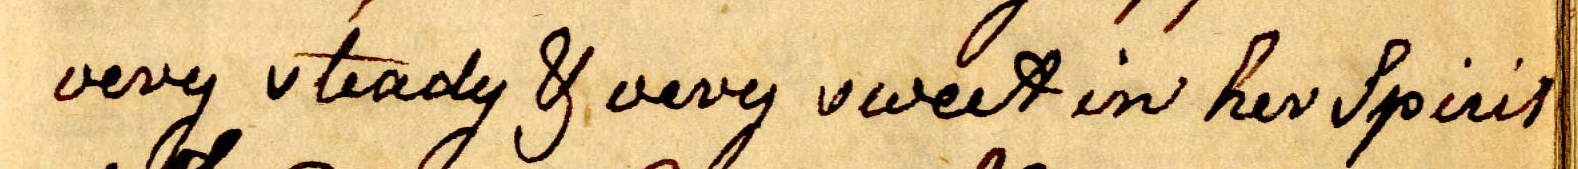very steady & very sweet in her Spirit
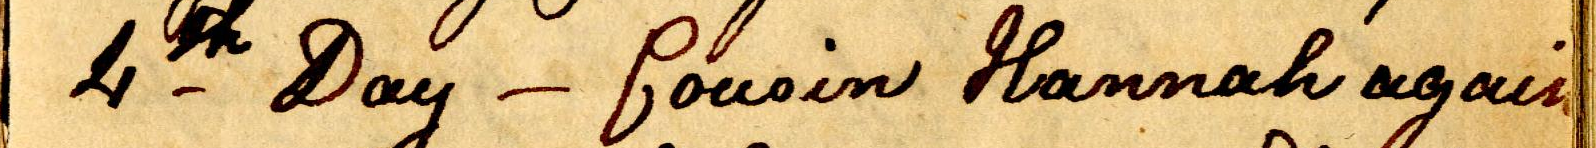4^th Day- Cousin Hannah again
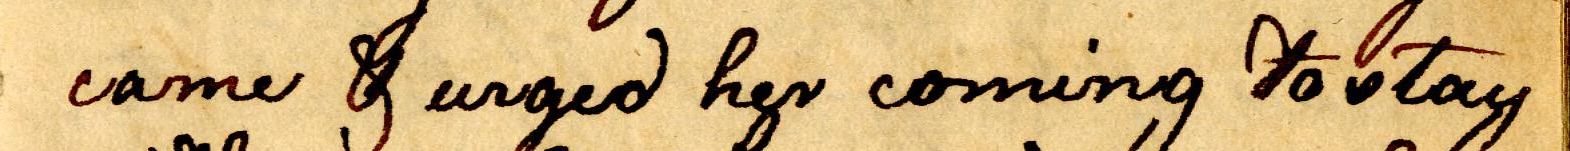came & urged her coming to stay
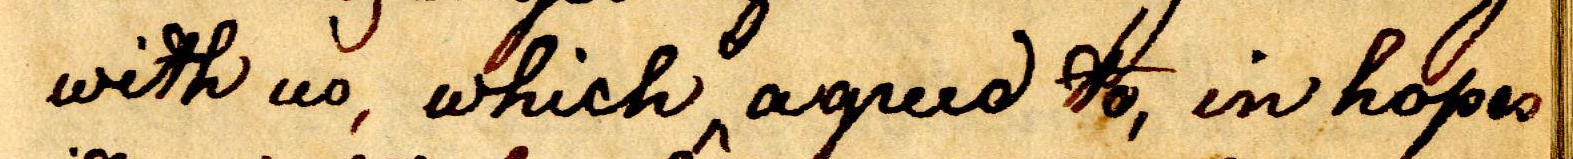with us, which agreed to, in hopes
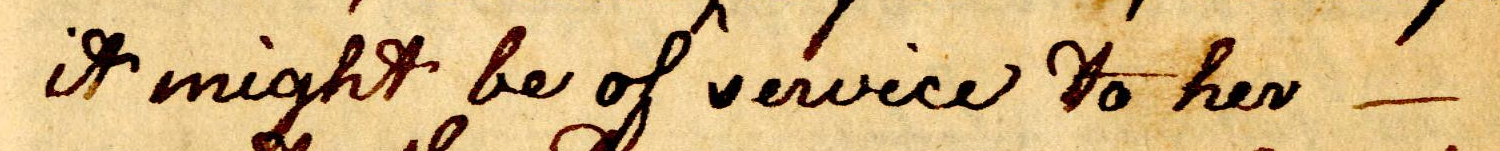it might be of service to her-
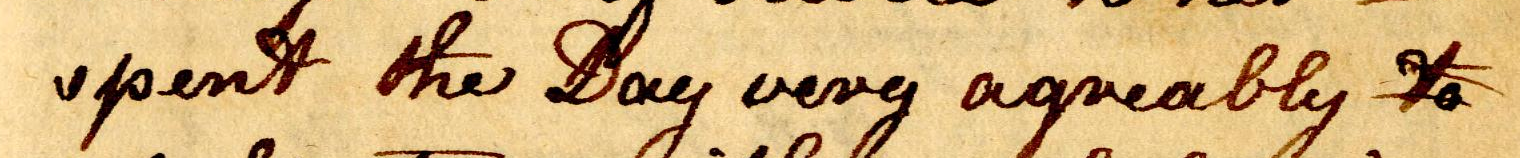spent the Day very agreably to
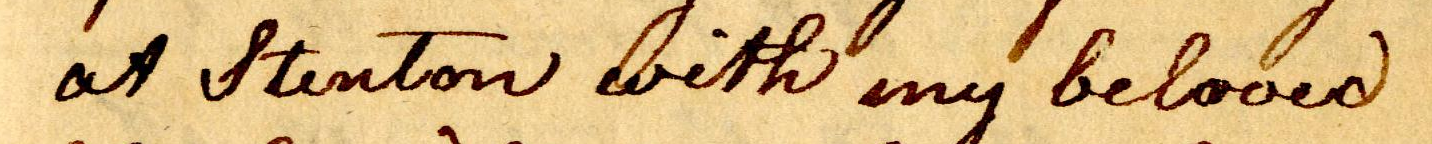at Stenton with my beloved
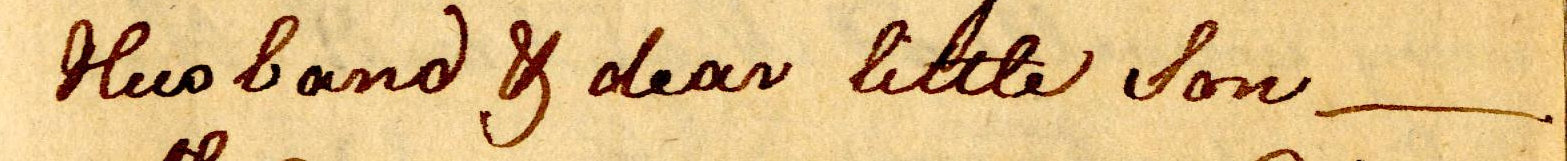Husband & dear little Son -
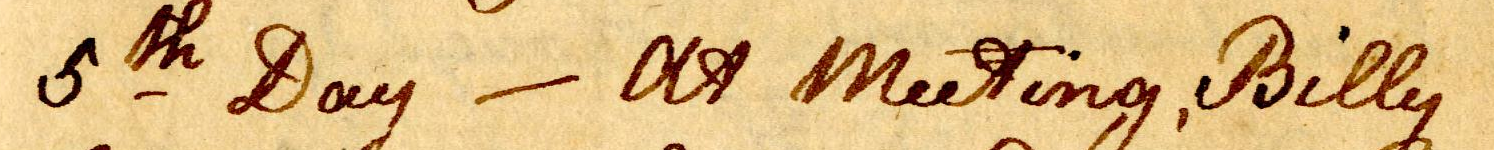5^th Day- At Meeting, Billy
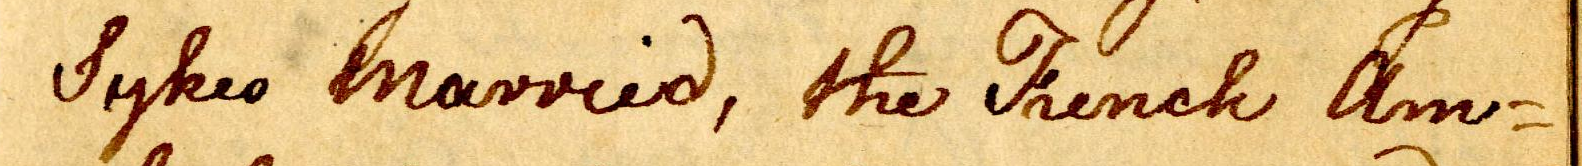Sykes Married, the French Am-
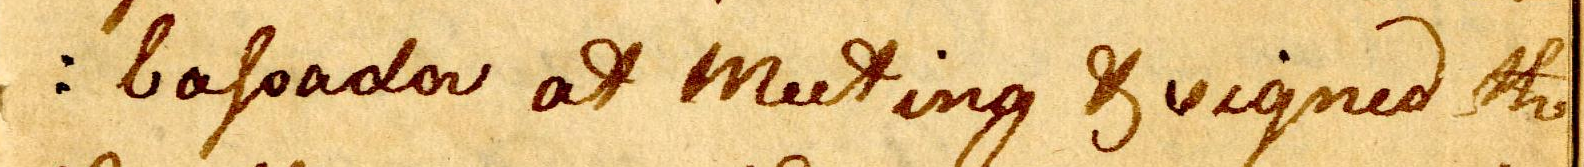-bassador at Meeting & signed the
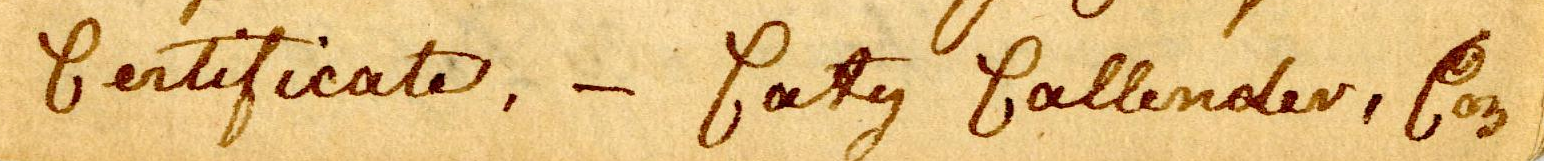Certificate,- Caty Callender , Coz
